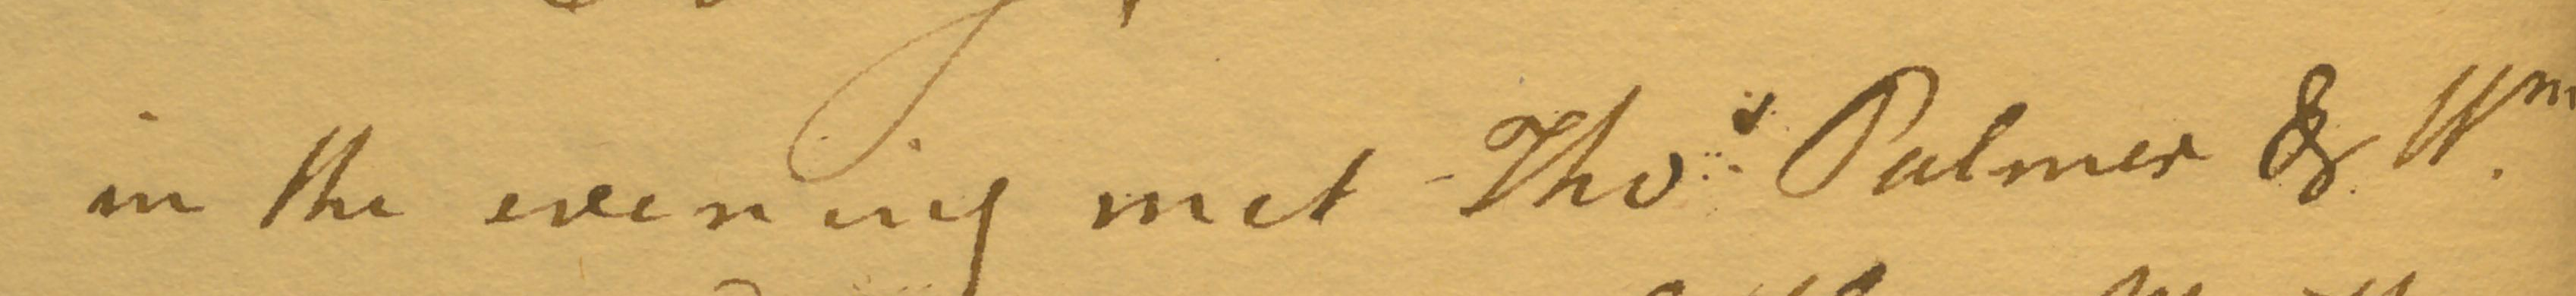in the evening met Tho^s. Palmer & W^m.
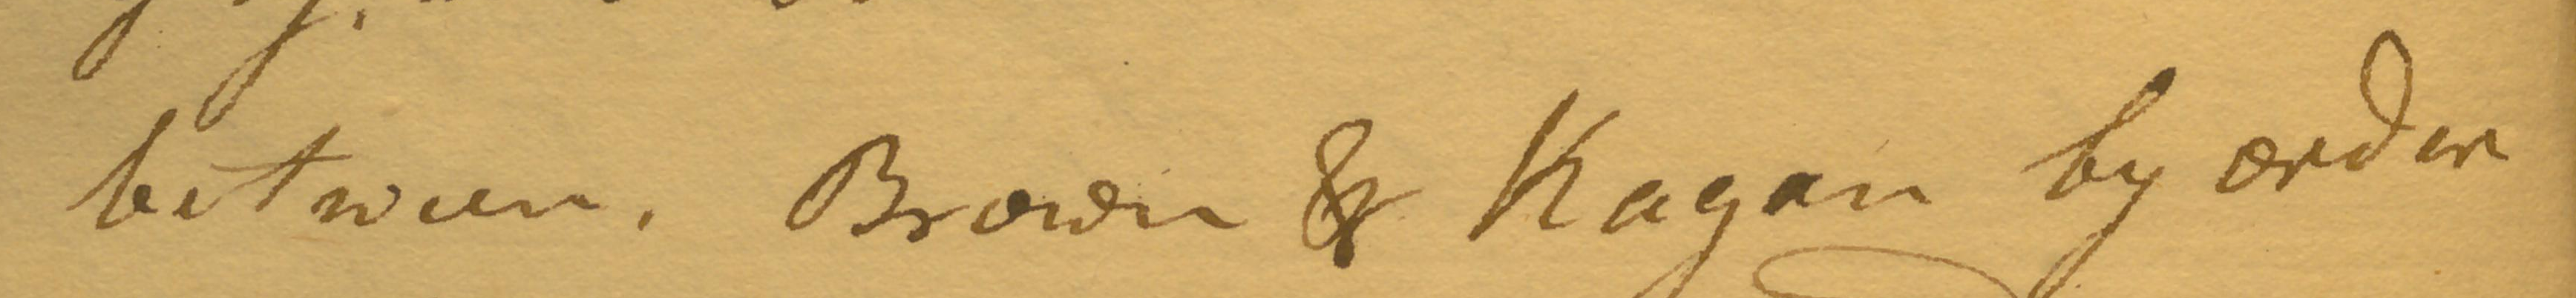between. Brown & Kagan by order
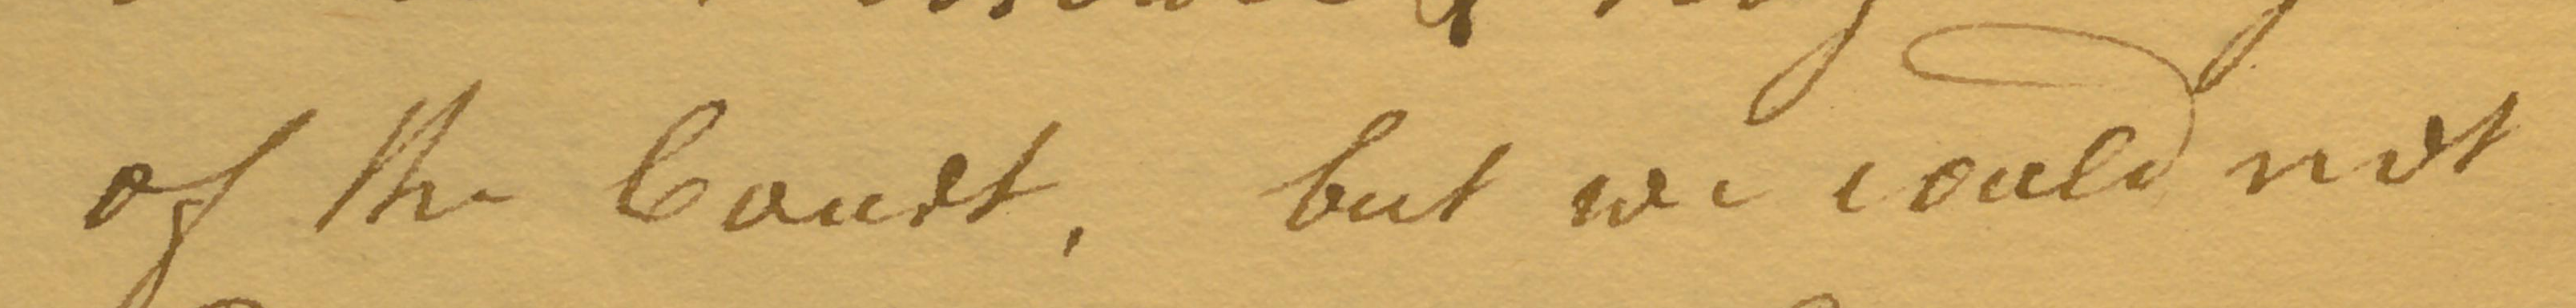of the Court but we could not
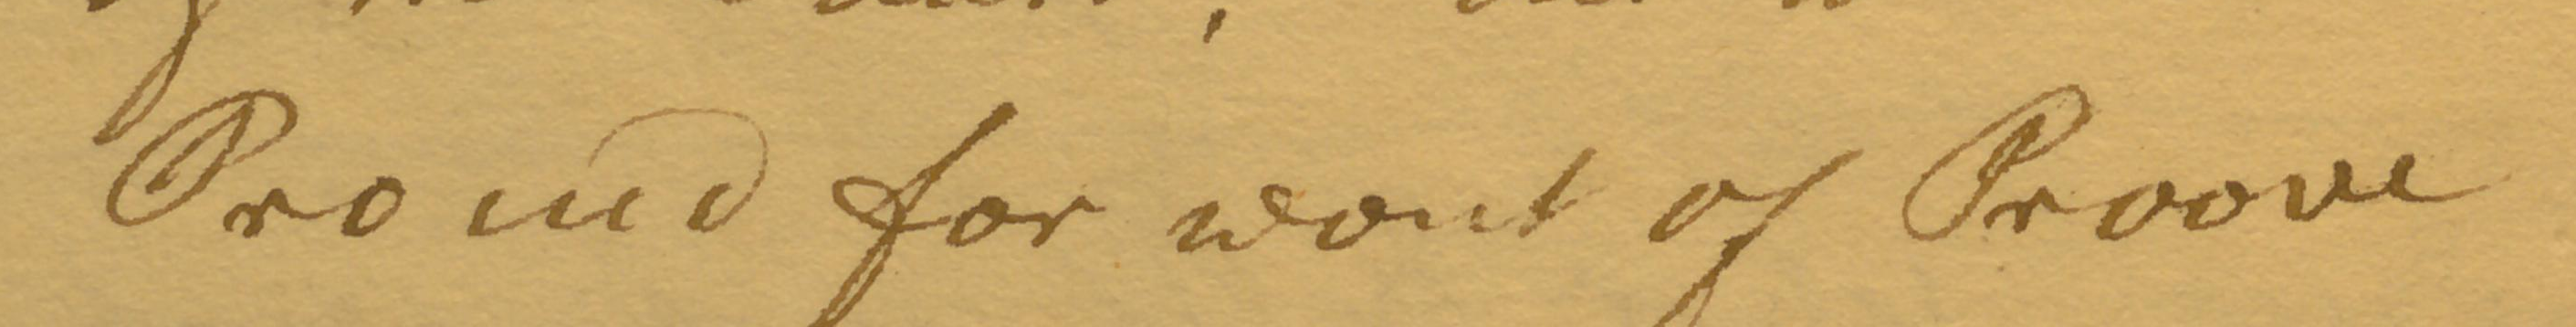Proceed for wont of Proove
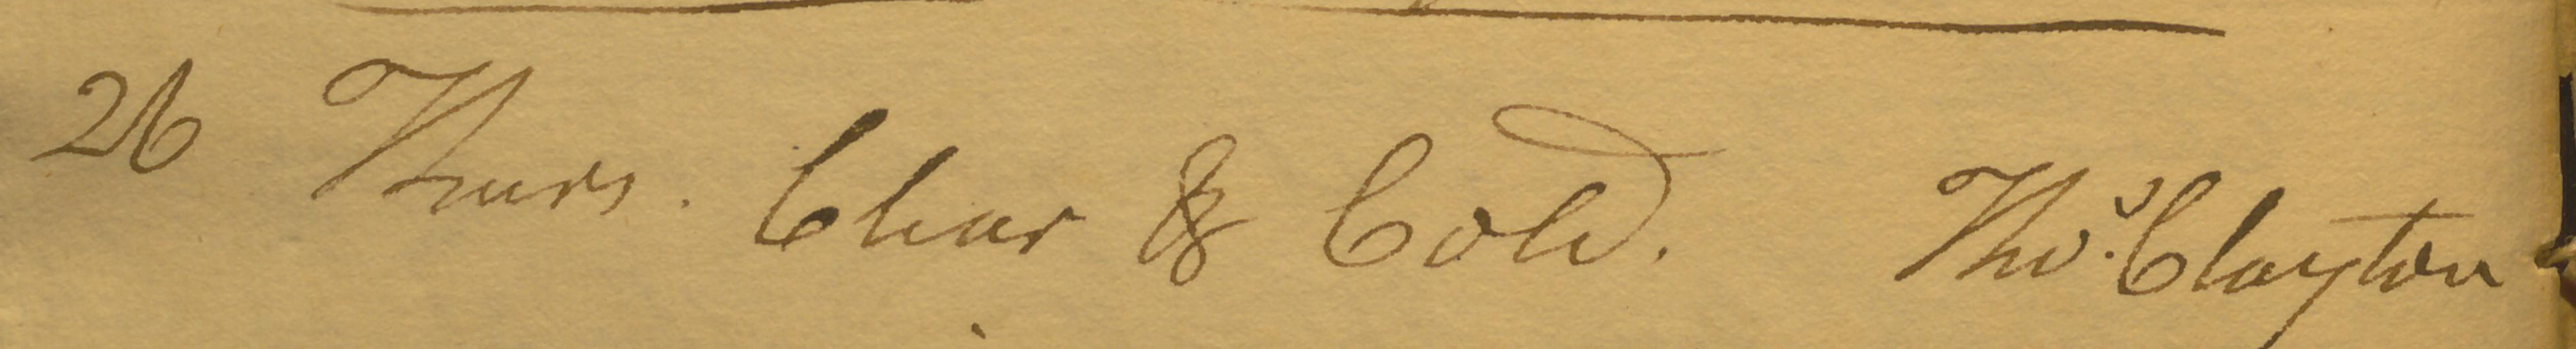26 Thurs. Clear & Cold. Tho^s Clayton
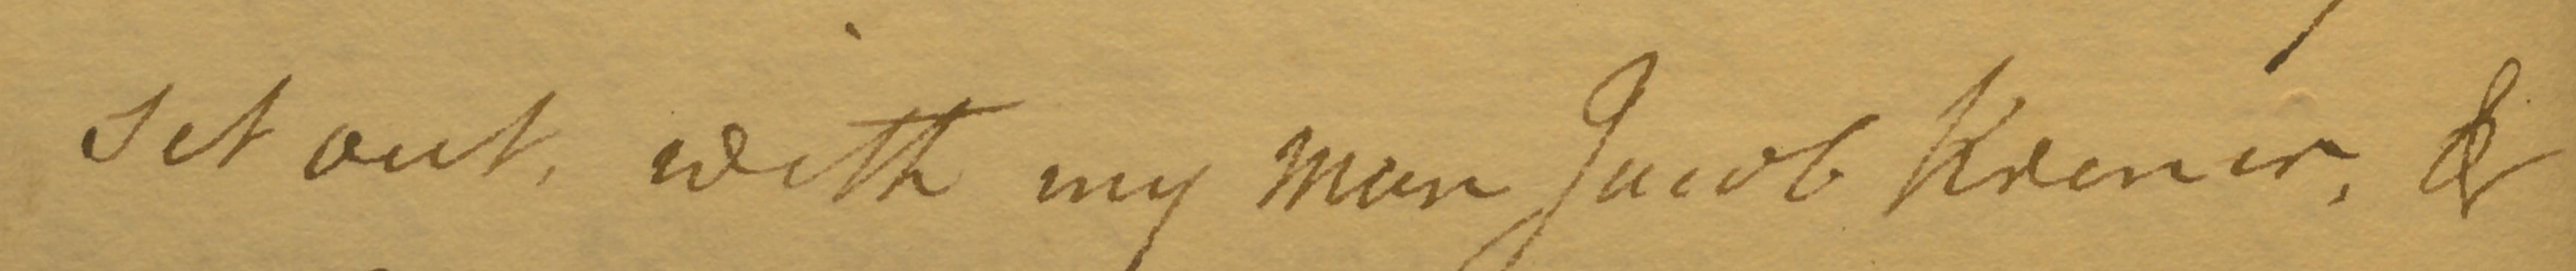set out, with my Man Jacob Krener, &
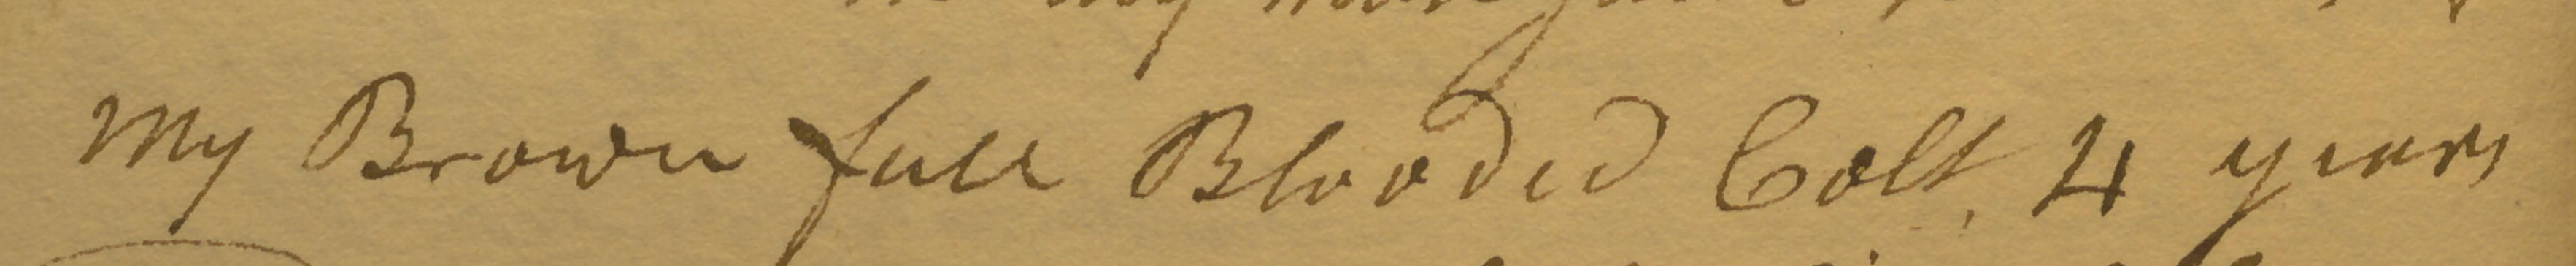My Brown full Blooded Colt 4 years
